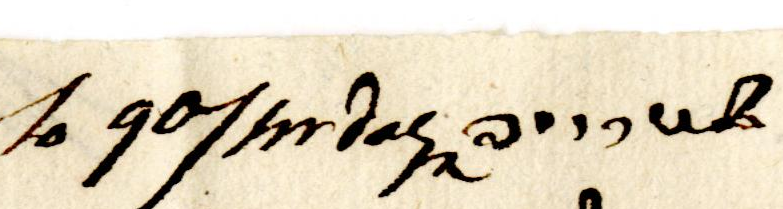To 90s per day
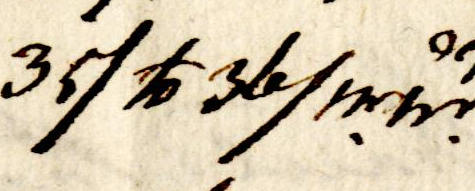35s to 36s per w^k
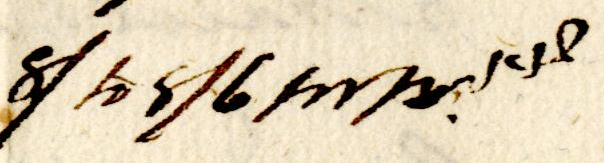8s to 8s6 per
